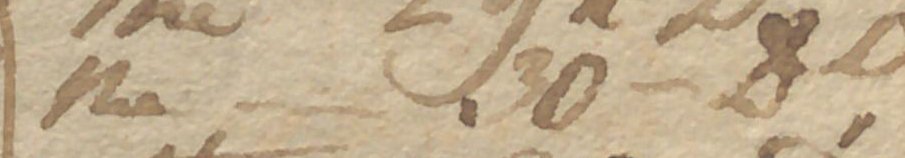the 30 D^o.
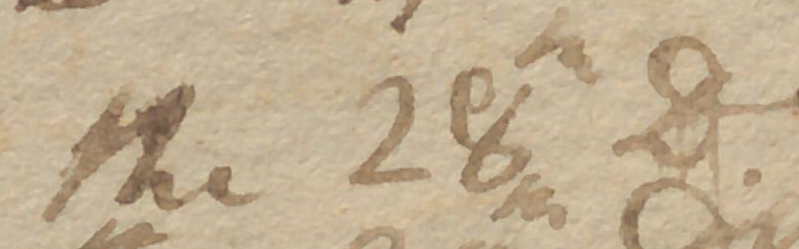the 28^th D^o.
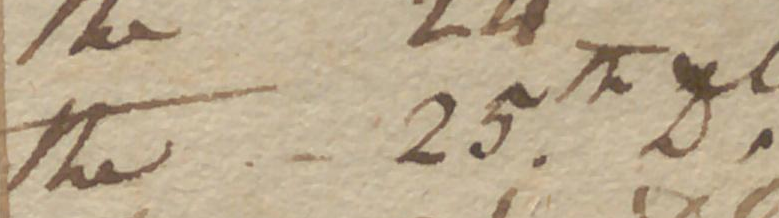the 25^th. D^o.
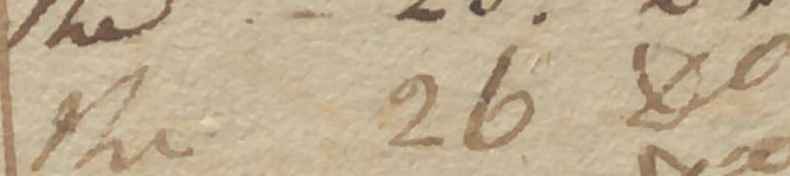the 26 D^o
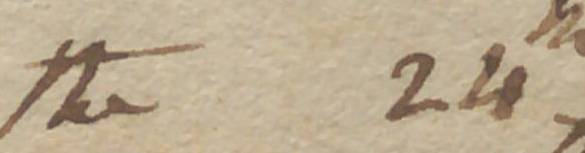the 24^th
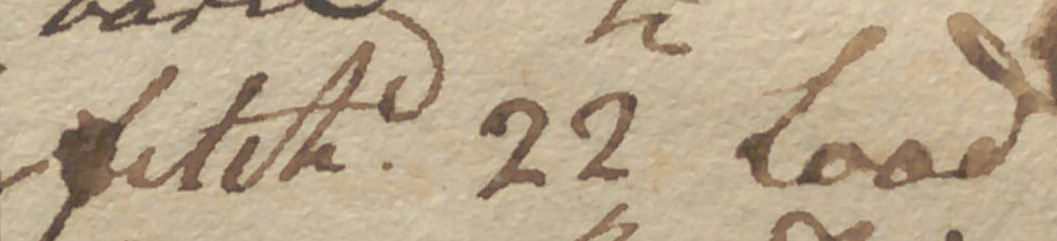fetch^d. 22^th load
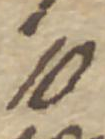10
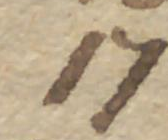17
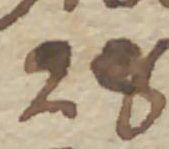28
